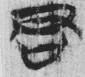君
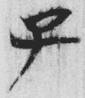子
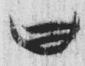曰
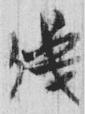俤
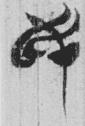民
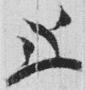之
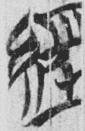經
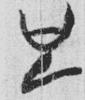也
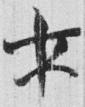才（在）
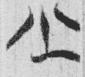少（小）
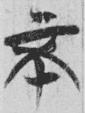不
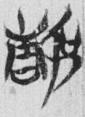靜（爭）
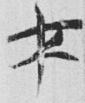才（在）
